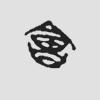會
